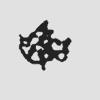𡄹
